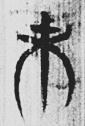末
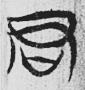君
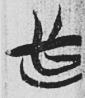必
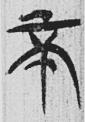不
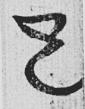已
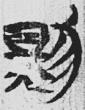則
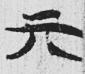亓
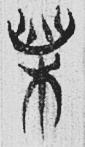本B（本）
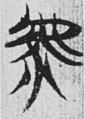{虍介}
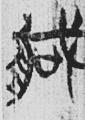○（莊）
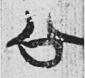公
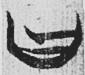曰
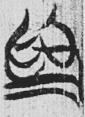爲
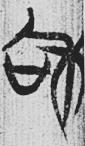和
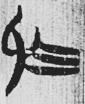於
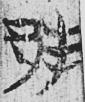邦
